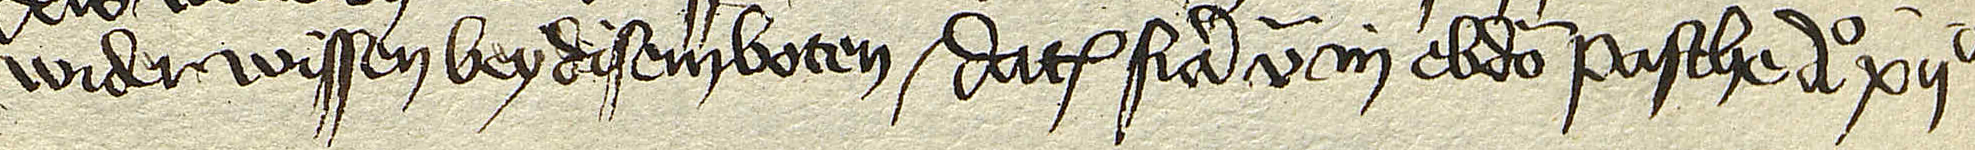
wider wiſſen bey diſem boten / dat* fia* v* in ebdo* paſche A* xii*
